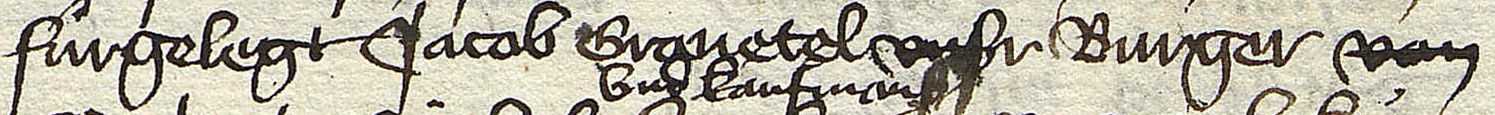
fürgelegt Iacob Granetel vnſ*r Burger von
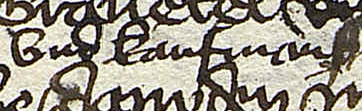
vnd kaufmanſ*
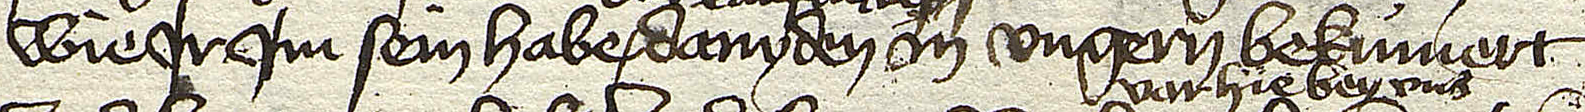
wie Ir Im ſein habe danyden in vngern bekümert
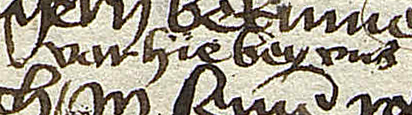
von hie bey vns
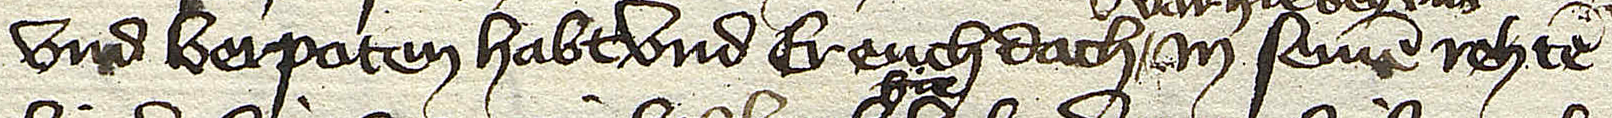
vnd verpoten habt Vnd Er euch doch in ſeine* rehte*
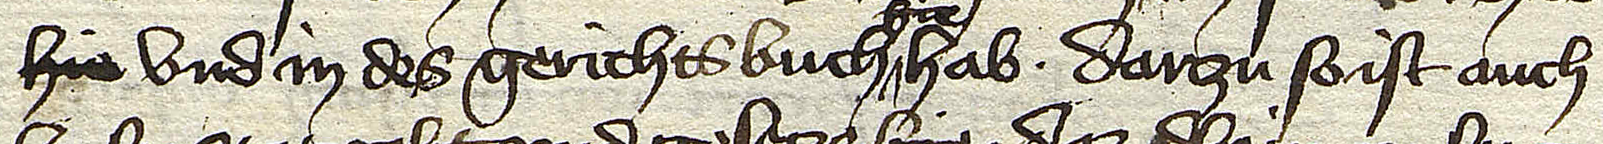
hie vnd in des gerichts buch hab . darcʒu ſo iſt auch
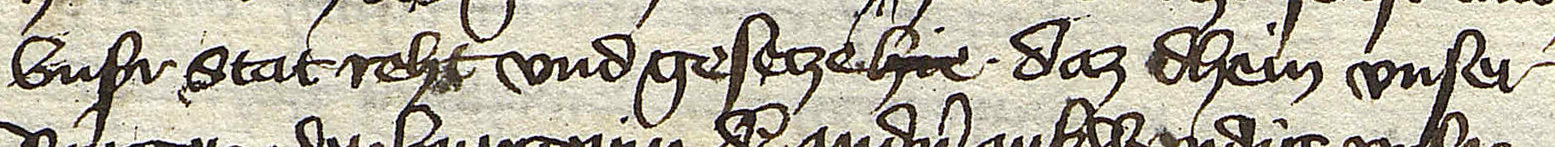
vnſ*r Stat reht vnd geſecʒe hie . daʒ d*hein vnſer
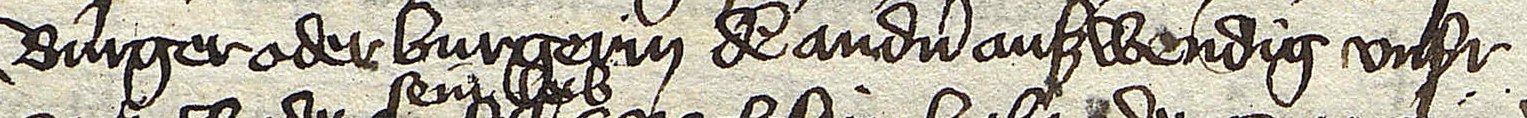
Burger oder burgerin de* and*n auſʒwendig vnſ*r
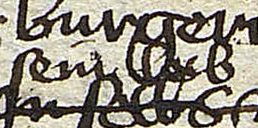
ſein leib
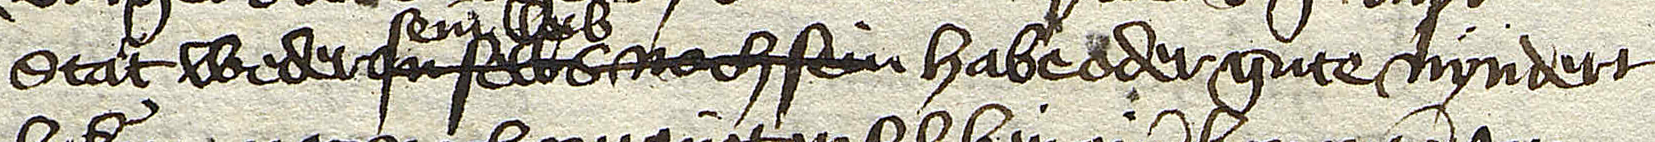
Stat weder In ſelbs noch ſein habe oder gute nyndert
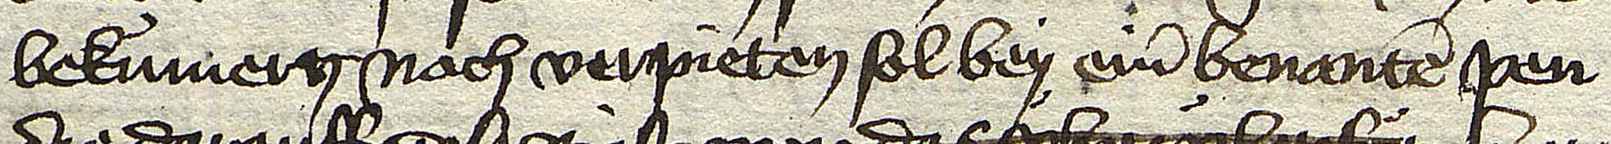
bekümern noch verpieten ſol bey ein* benante* pen
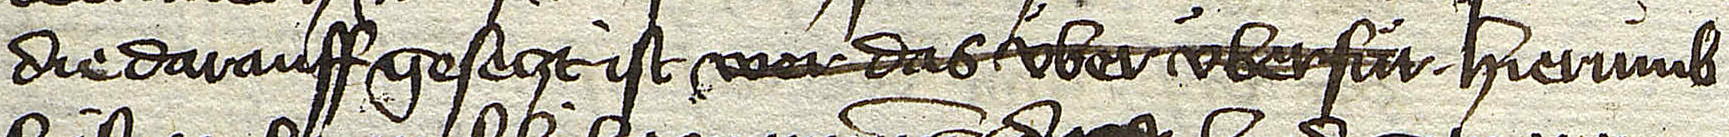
die darauff geſecʒt iſt wer das v̈ber vber für . hierümb
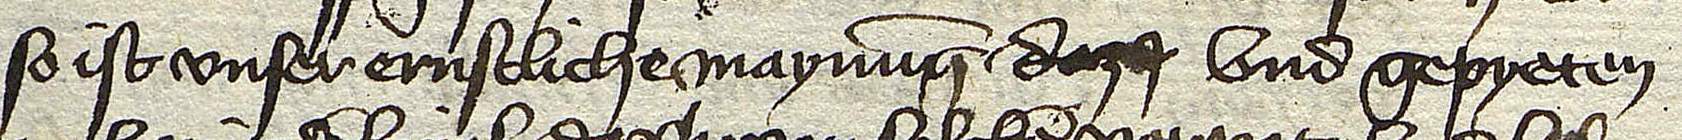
ſo iſt vnſer ernſtliche maynu*g / daʒ I vnd gepyeten
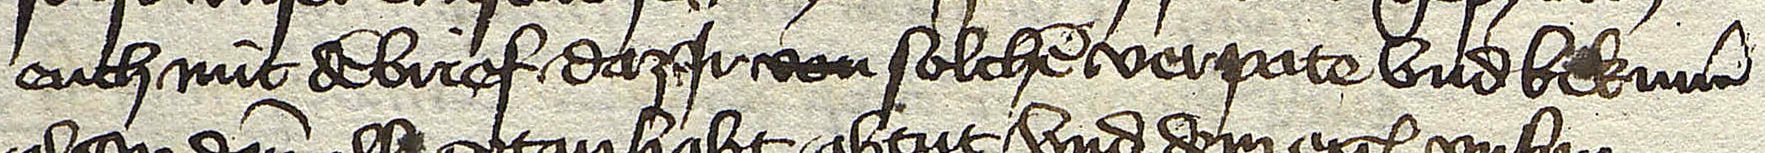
euch mit de* brief / daʒ Ir von ſolche* verpote vnd bekum*
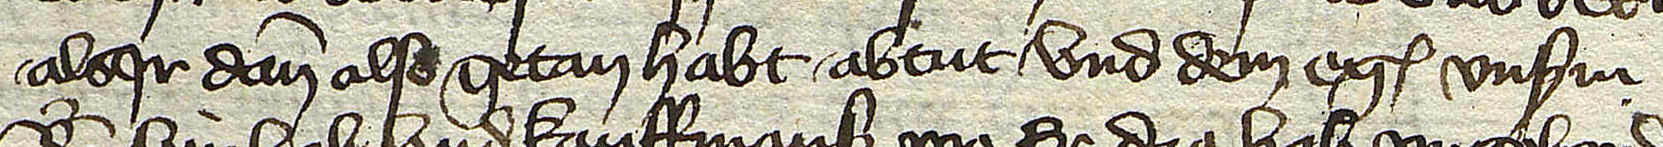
/ als Ir dan* alſo getan habt / abtut / vnd dem eg* vnſ*m
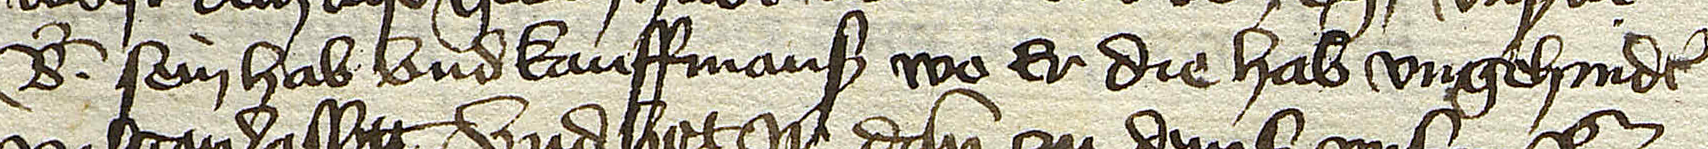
B* . ſein hab vnd kauffmanſ* wo Er die hab vngehindt*
